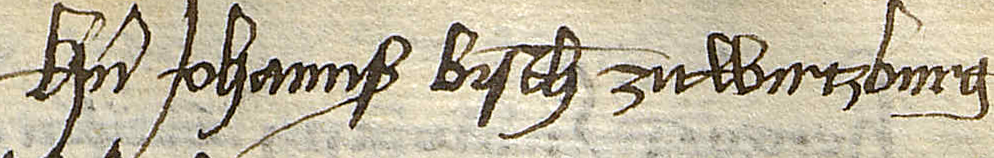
Hn* Iohannſ* biſch* ʒu Wircʒburg
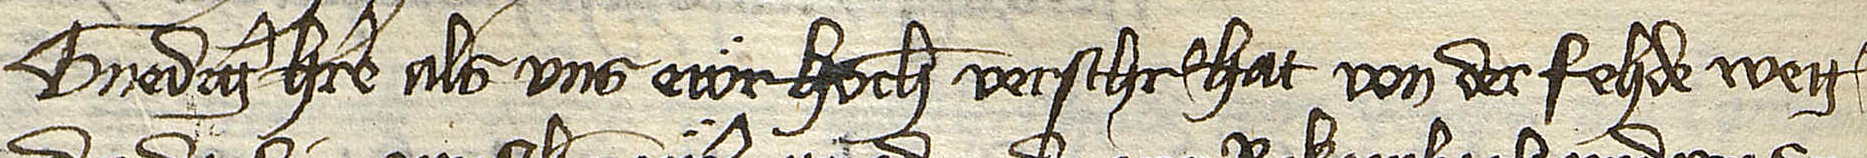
Gnedig* h*re als vns eẅr hoch* verſchr* hat von der fehde weg*
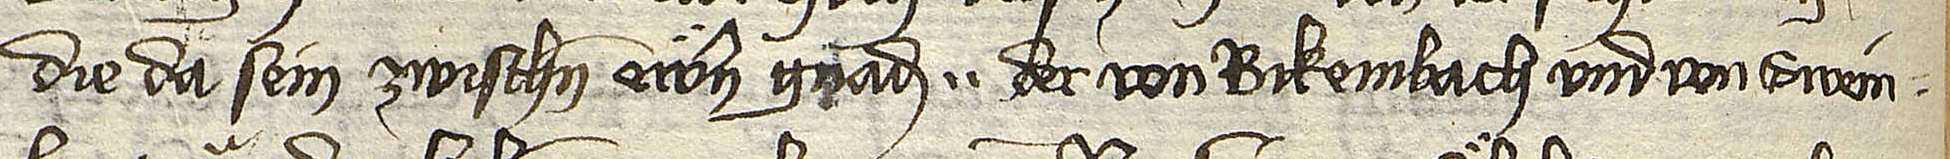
die da ſein ʒwiſchn* eẅ*n gnad* ~ der von Bikembach vnd von Swein =
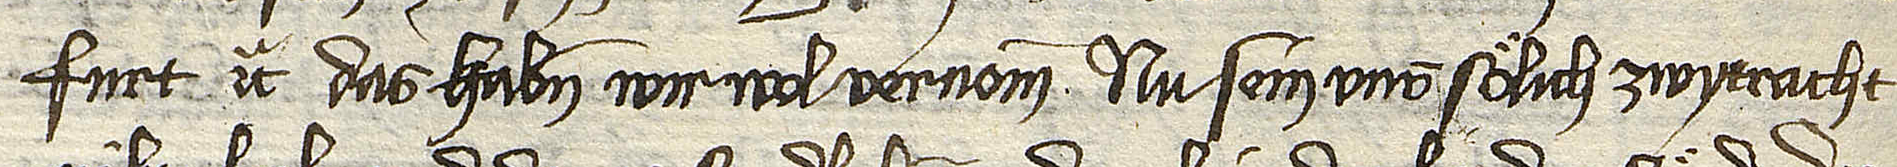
furt ec* das habn* wir wol vernom* . Nu ſein vns ſölich ʒwytracht
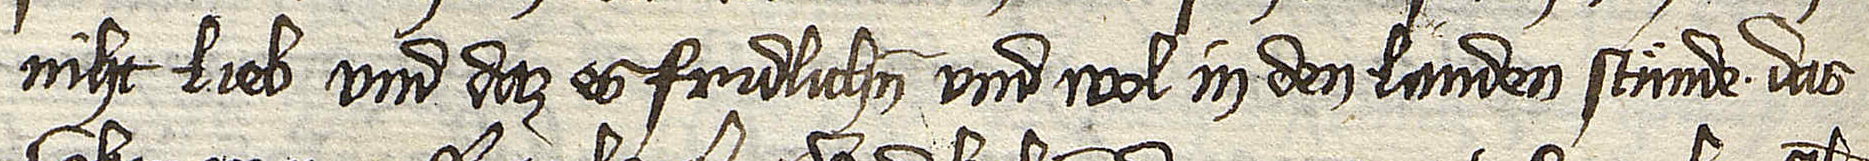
niht lieb vnd daʒ es fridlichn* vnd wol in den landen ſtünde . das
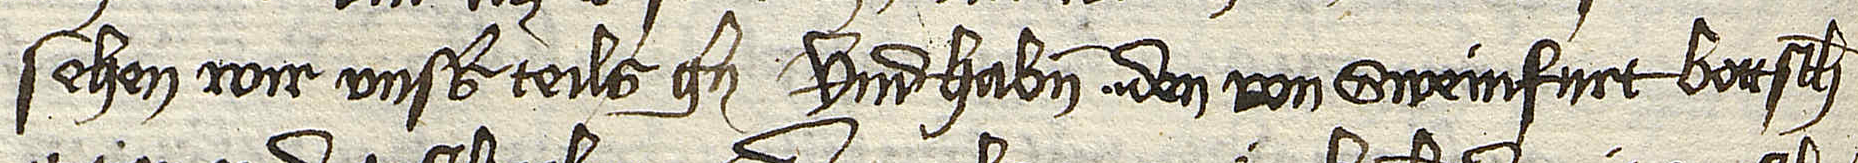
ſehen wir vnſ*s teils g*n / Vnd habn* ~ den von Sweinfurt bottſch*
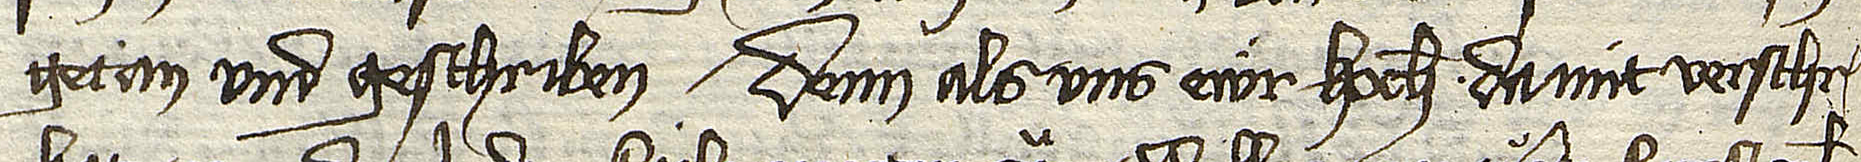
getan vnd geſchriben / Denn als vns eẅr hoch* . Damit verſchr*
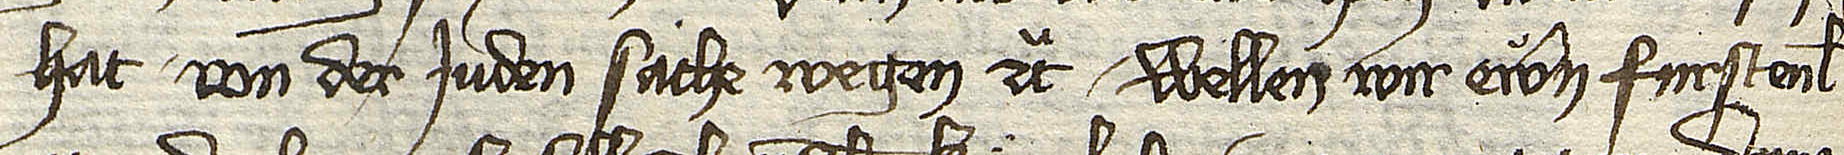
hat / von der Iuden ſache wegen ec* / Wellen wir eẅ*n furſtenl*
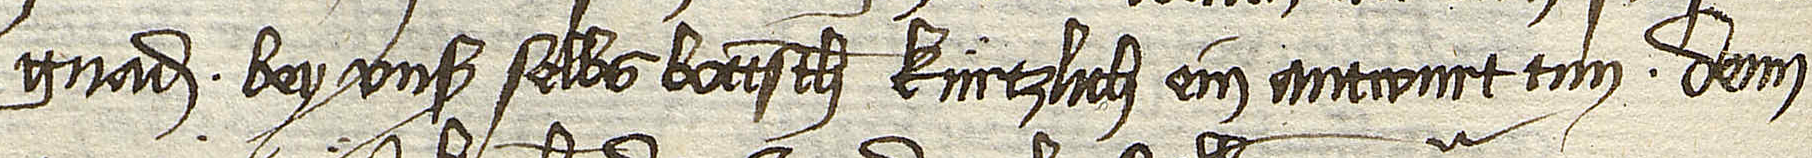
gnad* . bey vnſ* ſelbs bottſch* kürcʒlich ein antwurt tun . denn
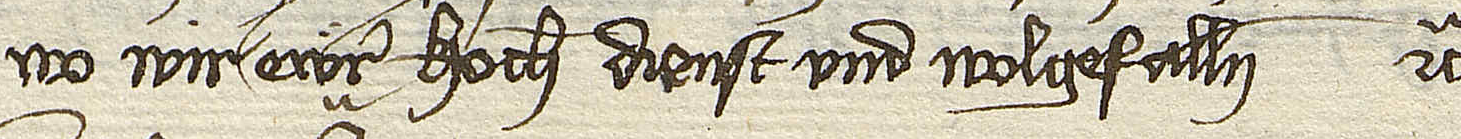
wo wir eẅr* hoch* dienſt vnd wolgefalln* ec*
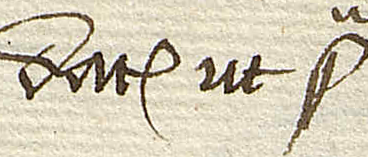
Dat* ut ſ*
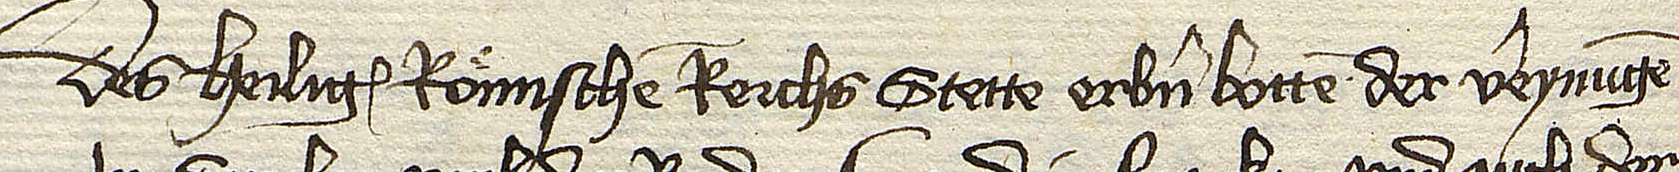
Des heilig* Römiſche* Reichs Stette erbn* botte* . der v*eynu*ge*
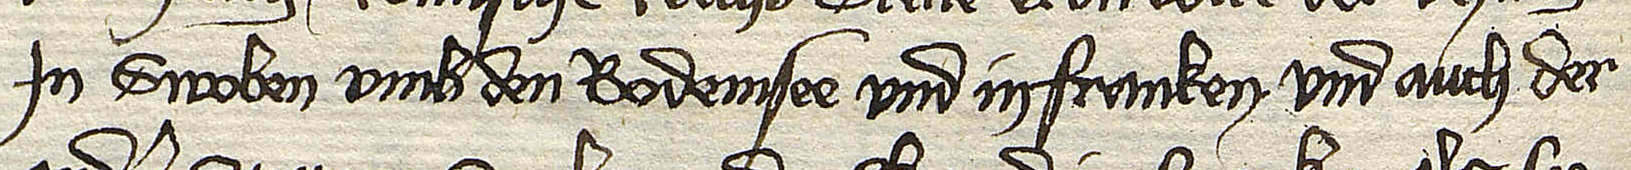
In Swoben vmb den Bodemſee vnd in franken . vnd auch der
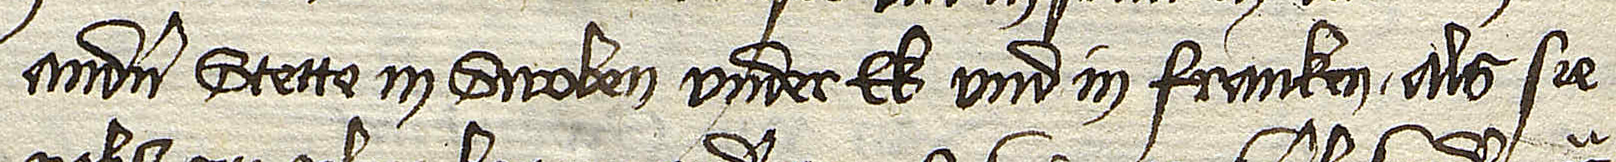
andn* Stette in Swoben vnder Ek vnd in franken / als ſie
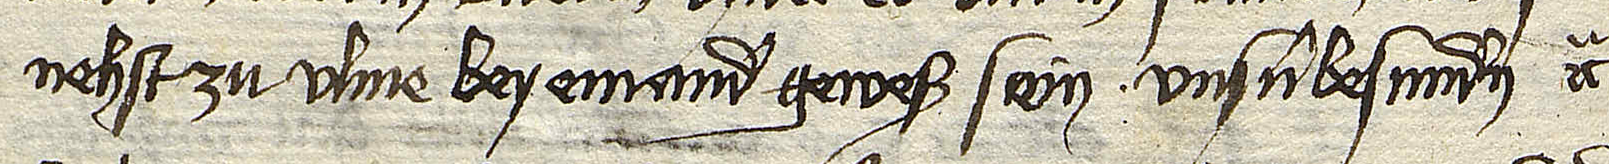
nehſt ʒu vlme bey einand* geweſ* ſein . vnſn* beſund*n ec*
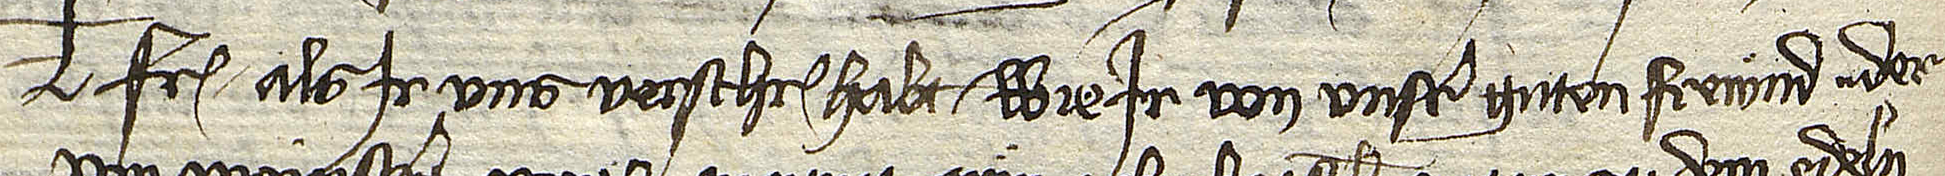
L* Fr* / als Ir vns verſchr* habt / wie Ir von vnſr* guten freẅnd ~ der
